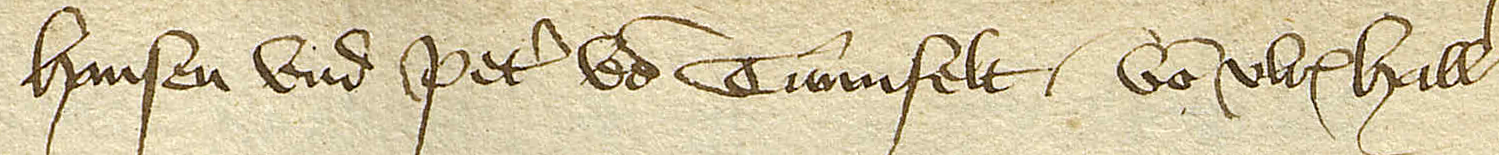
hanſen vnd Pet* vo* Türmfelt / vo* vlr* hall*
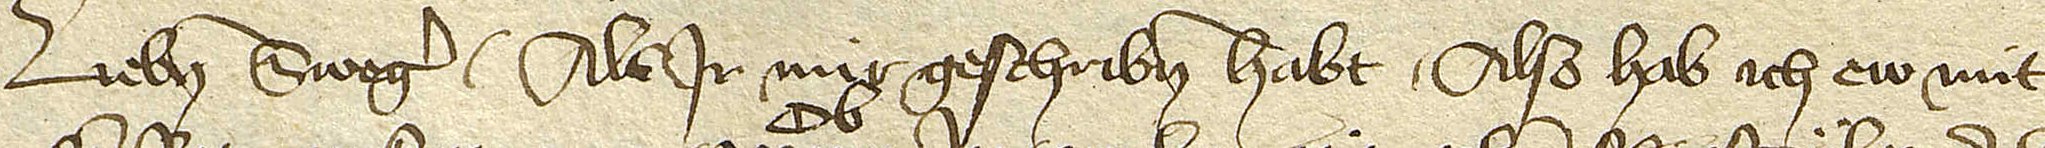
Liebn* Sweg* / Als Ir mir geſchribn* habt / Alſo hab ich ew mit
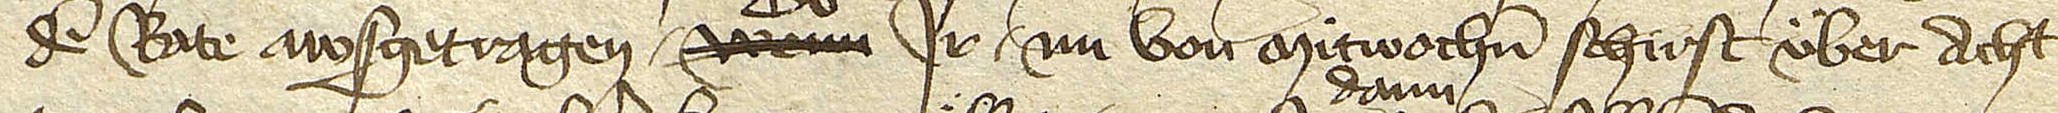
d* Rate awſgetragen / wenn Ir / nu von Mitwochn* ſchirſt v̈ber Acht
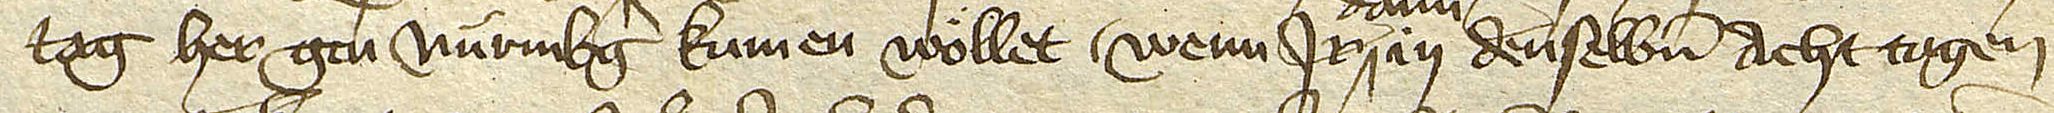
tag her gen Nürmbg* kumen wöllet / wenn Ir in denſelbn* Acht tagen
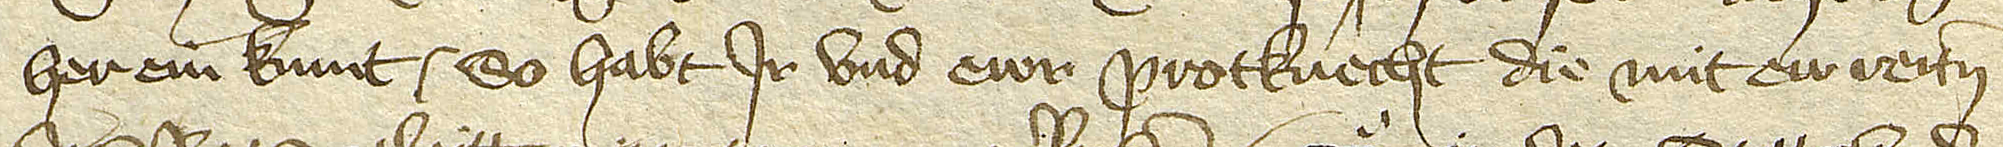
her ein kümt / So habt Ir vnd ewr protknecht die mit ew reitn*
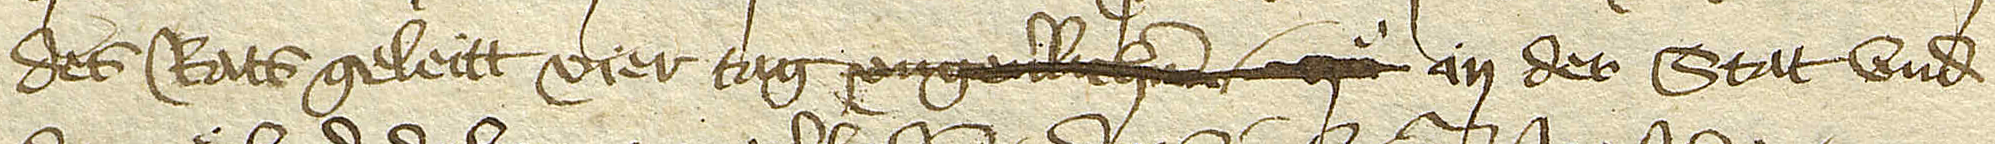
des Rats geleitt vier tag vngeu*lichn* / cʒü in der Stat vnd
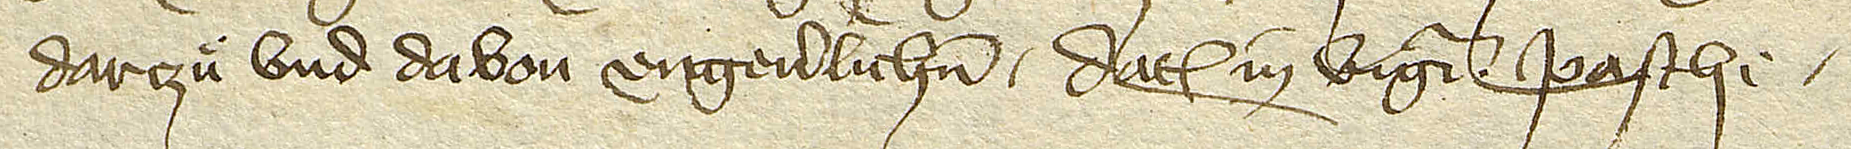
darcʒü vnd davon vngeu*lichn* / Dat* in vigi* . Paſche /
